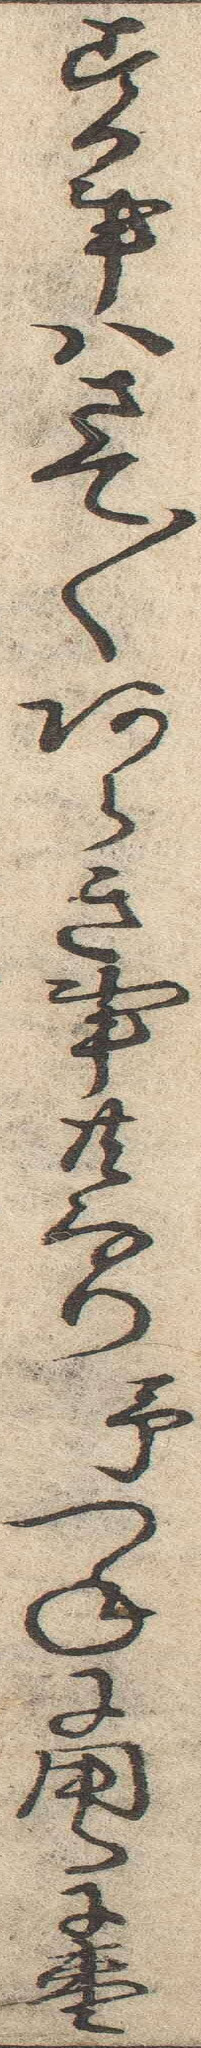する事はさて〳〵あらき事共なり予つねに用るに棗
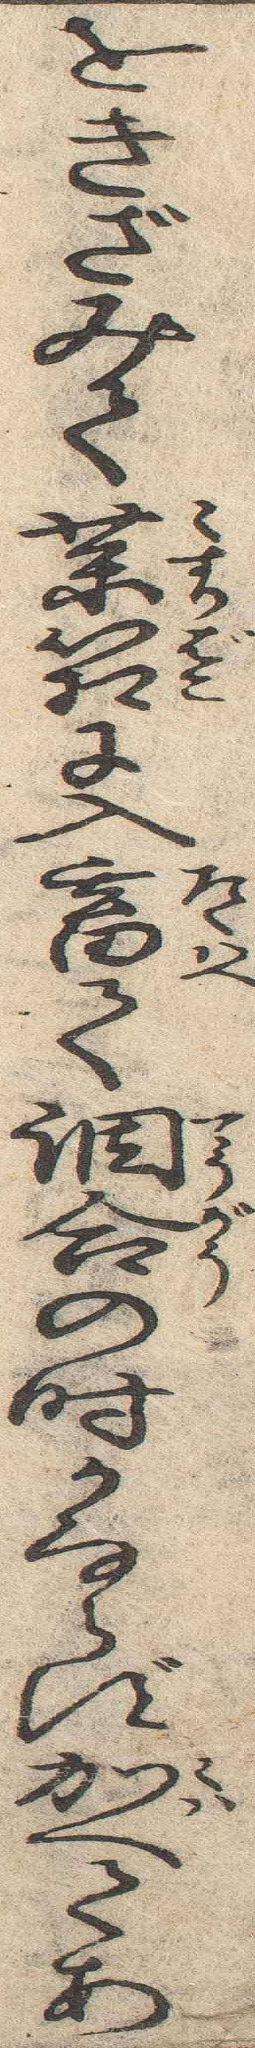をきざみて薬箱に入畜て調合の時かならず加へてあ
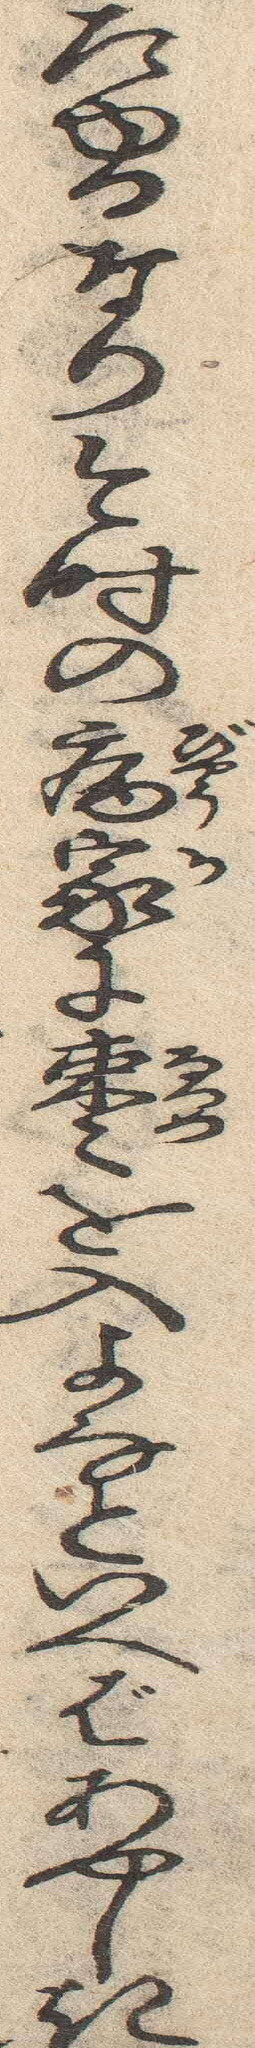たゆるなり今時の病家に棗を入よなといへばあやしき
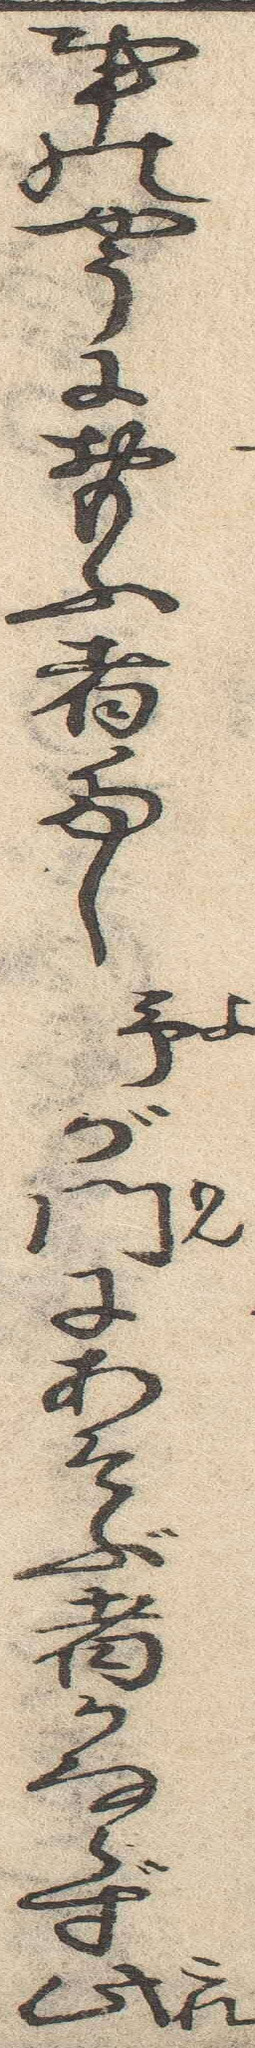事のやうにおもふ者多し予が門にあそぶ者かならず此
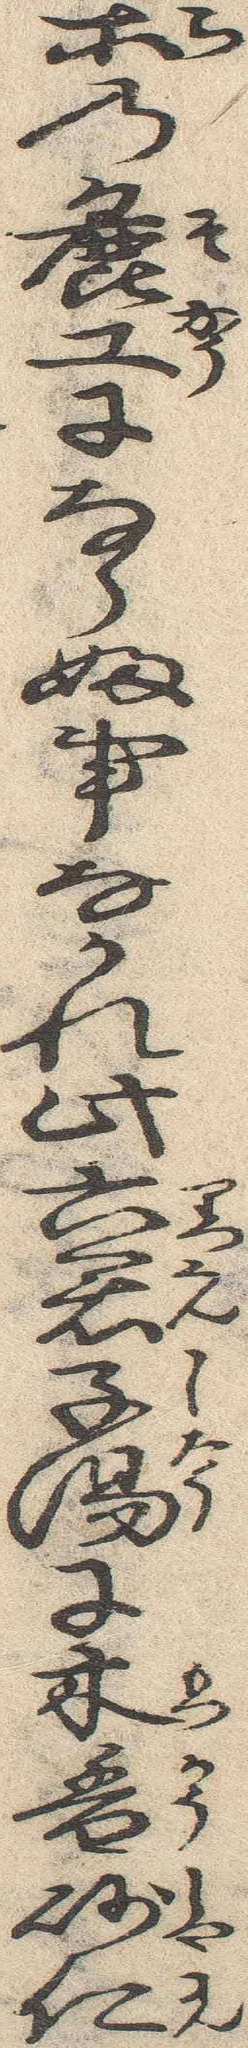等の麤工にならふ事なかれ此六君子湯に木香砂仁
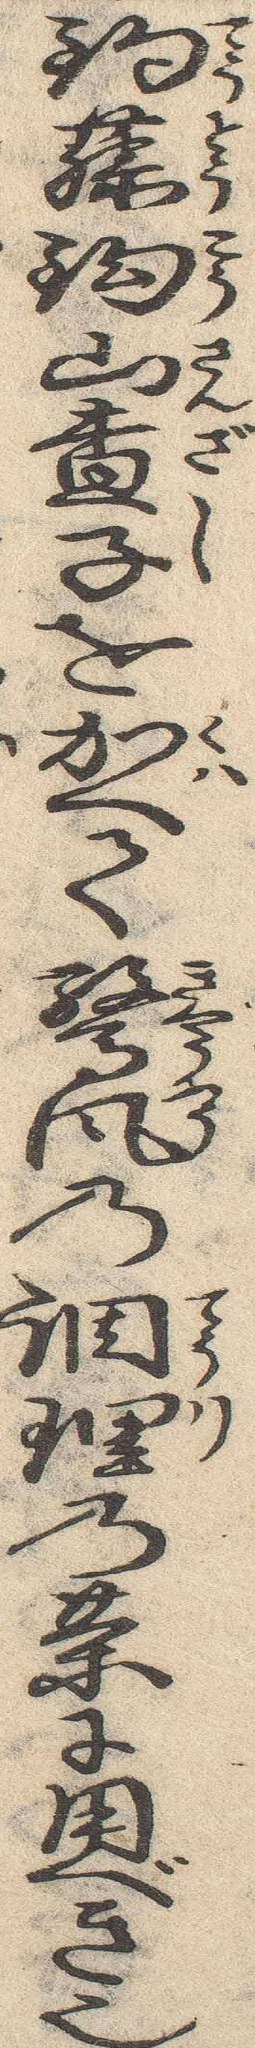釣藤鉤山査子を加へて驚風の調理の薬に用べき也
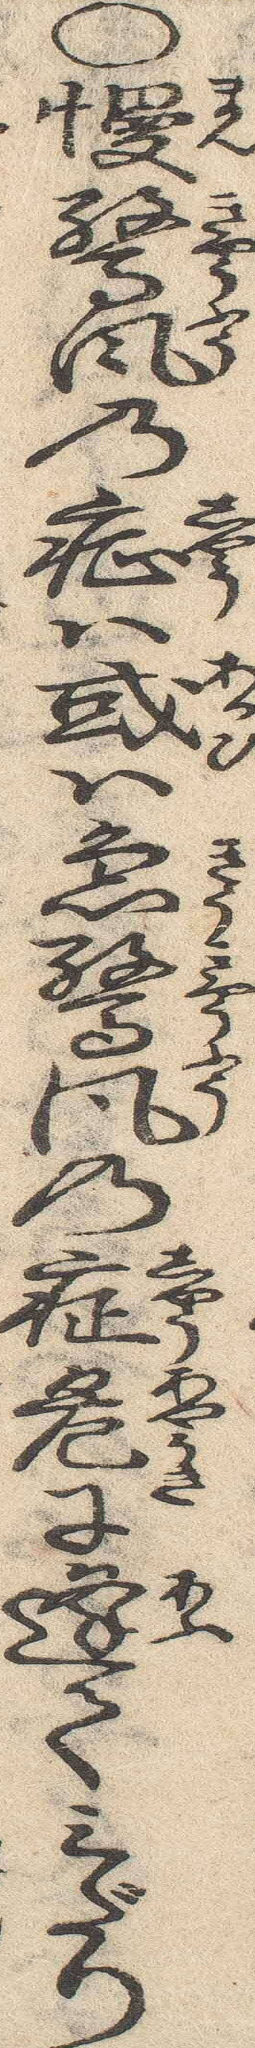○慢驚風の症は或は急驚風の症危に逢てみだり
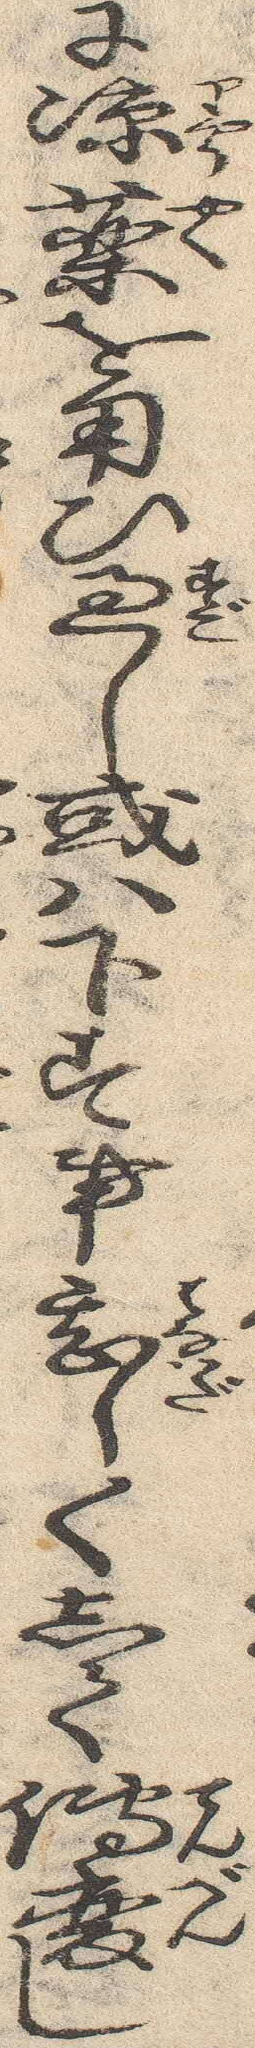に涼薬を用ひ過し或は下す事甚しくして伝変し
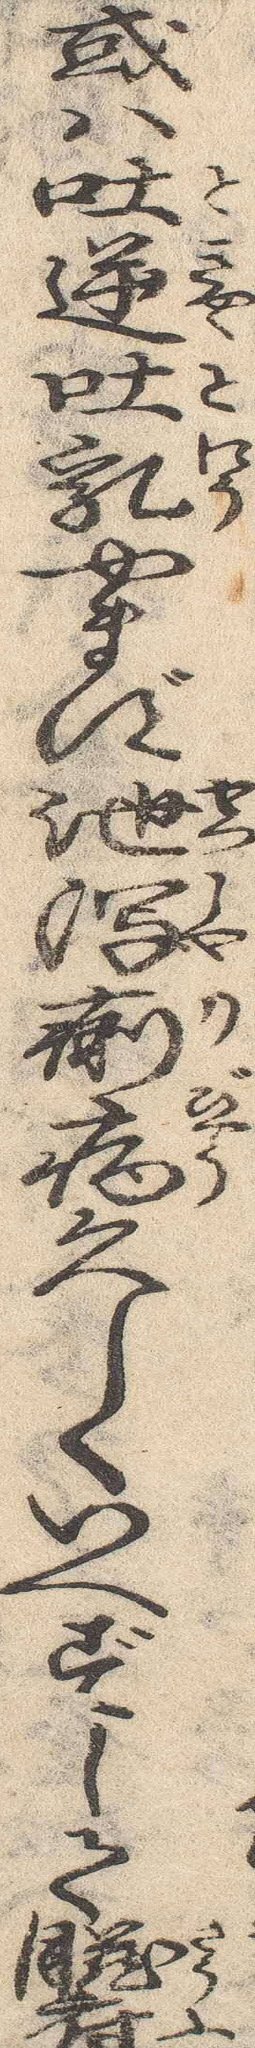或は吐逆吐乳やまず泄瀉痢病久しくいへずして臓府
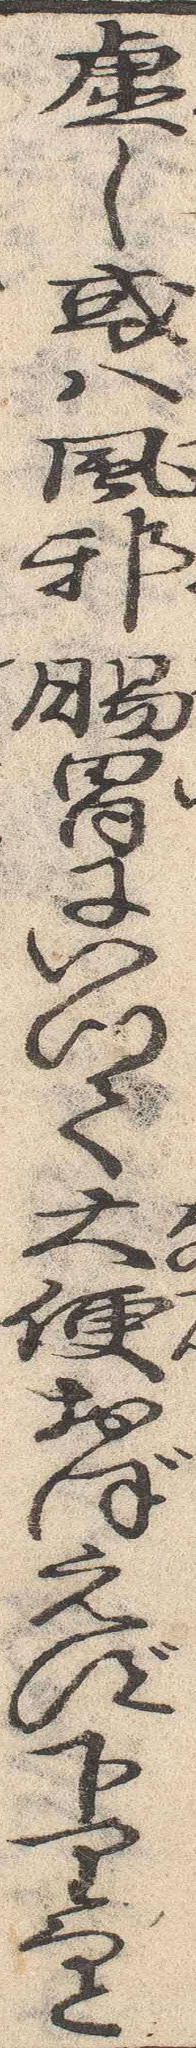虚し或は風邪腸胃にいつて大便おぼえず下りると
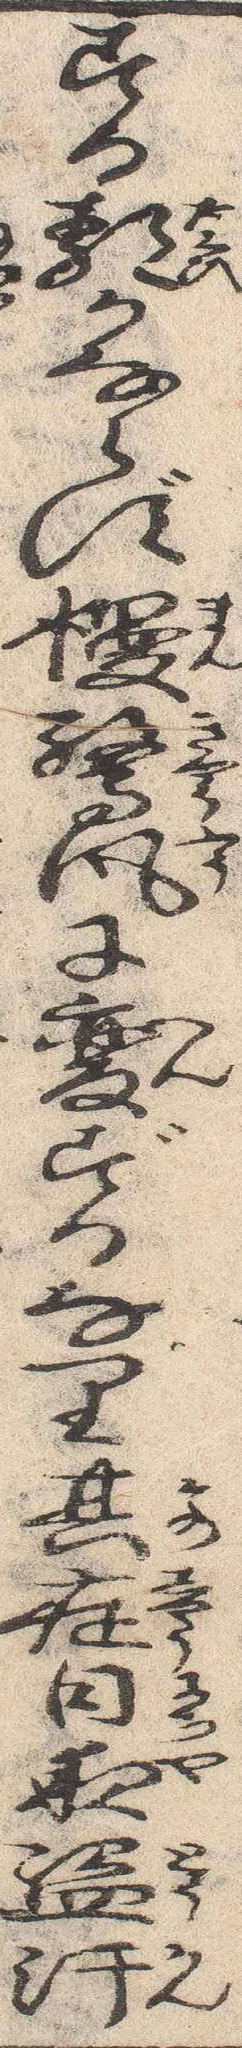する類かならず慢驚風に変ずるなり其症日夜盗汗
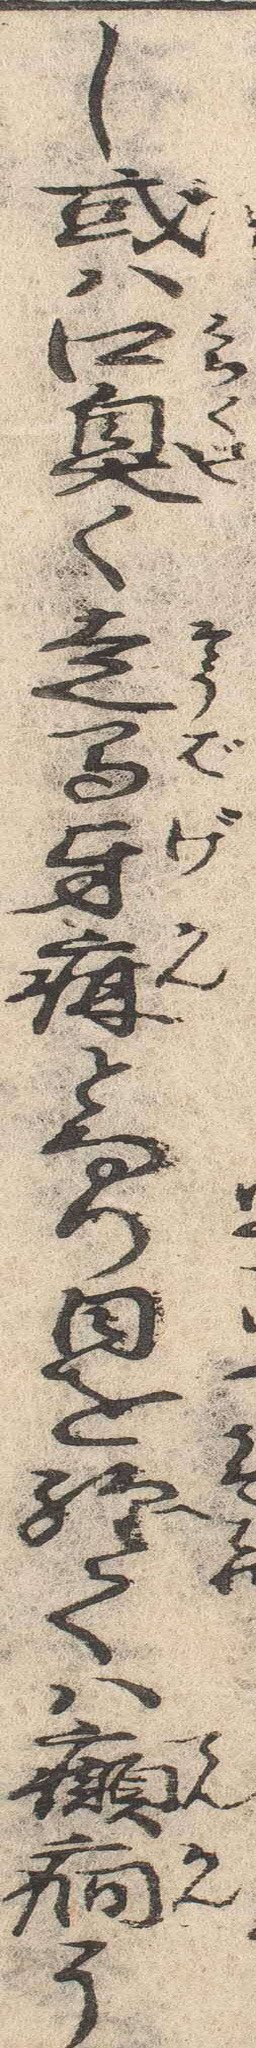し或は口臭く走馬牙疳となり目を経ては癲癇に
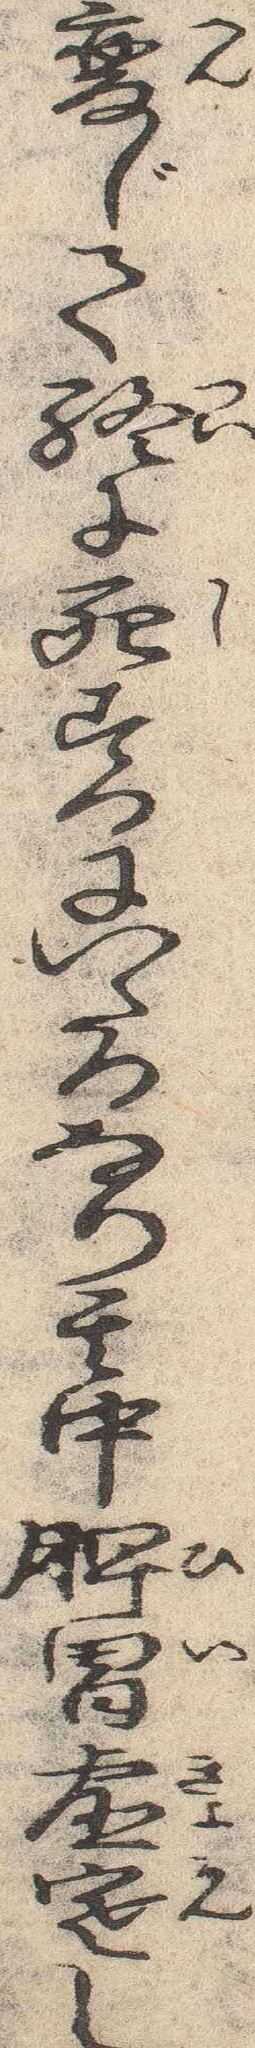変じて終に死するにいたるなり其中脾胃虚寒し
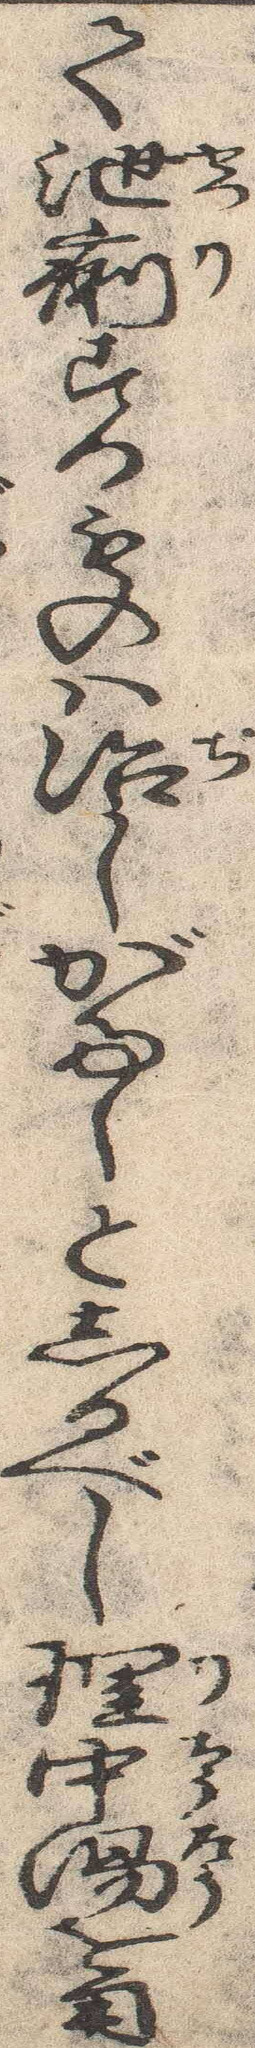て泄痢するものは治しがたしとしるべし理中湯を用
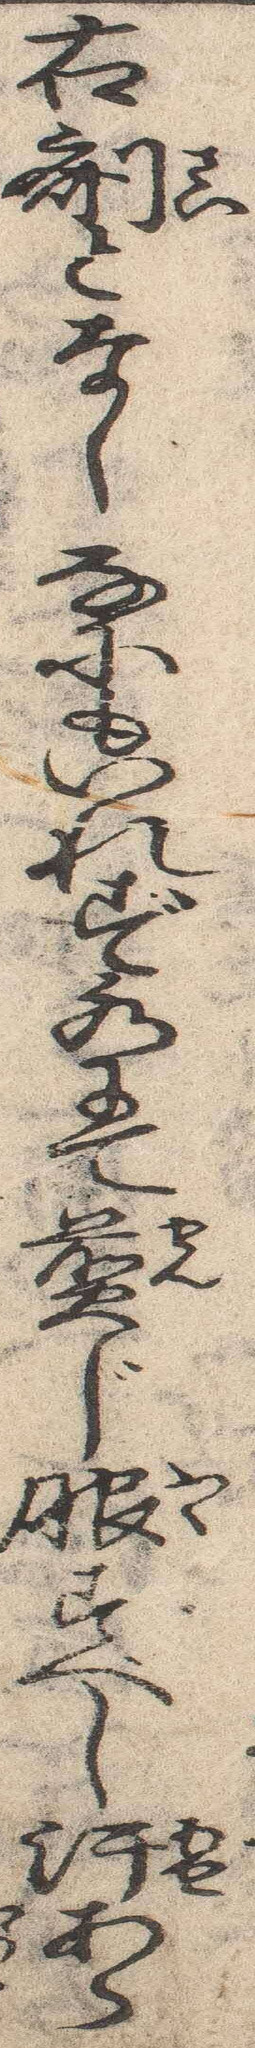右剤となしなにもいれず水にて煎じ服すべし汗あら
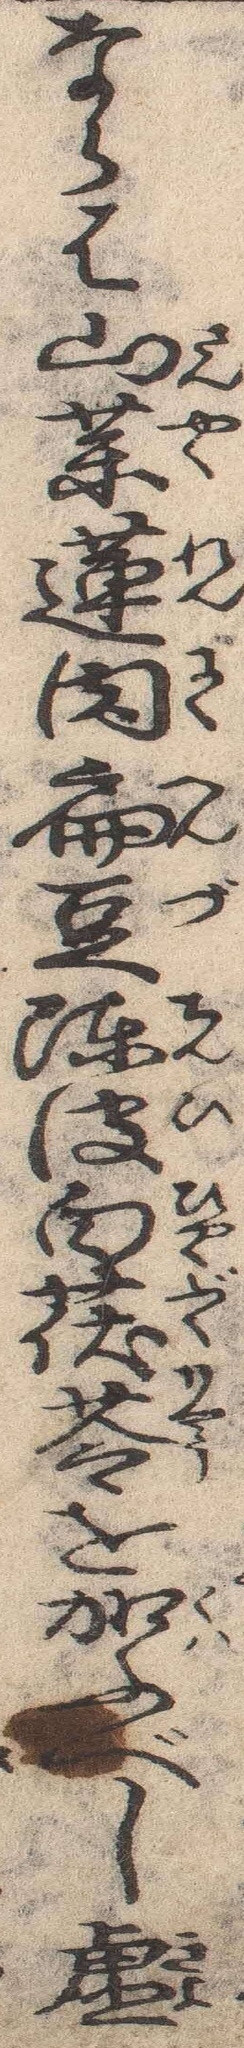ならは山薬蓮肉扁豆陳皮白茯苓を加ふべし虚
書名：小児必用養育草
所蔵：東京学芸大学附属図書館 国文学研究資料館
